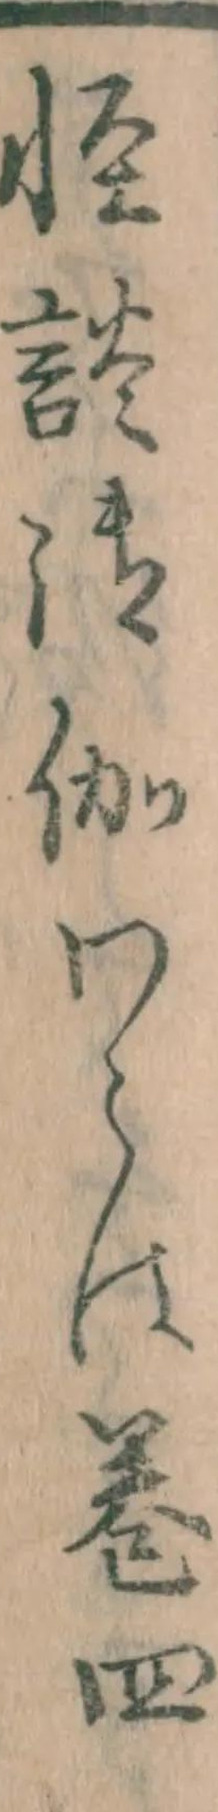怪談御伽わらは巻四
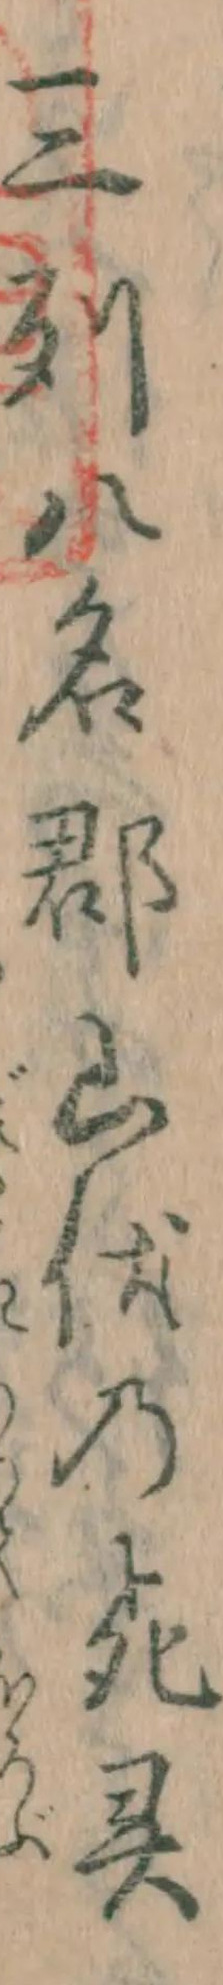三州八名郡山伏の死霊
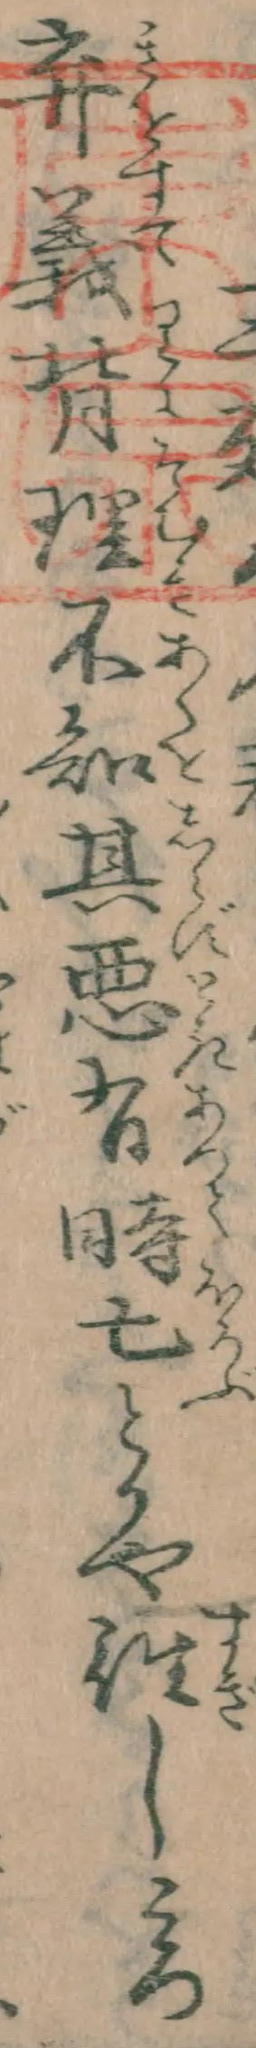棄義背理不知其悪有時亡とかや往しころ
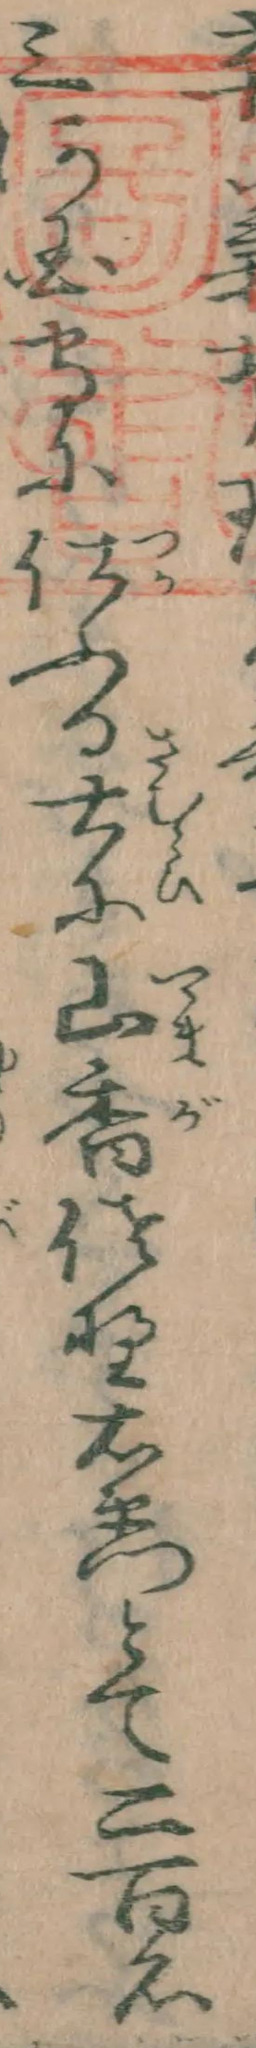三河国守に仕ふる士に山香佐野右衛門とて二百石
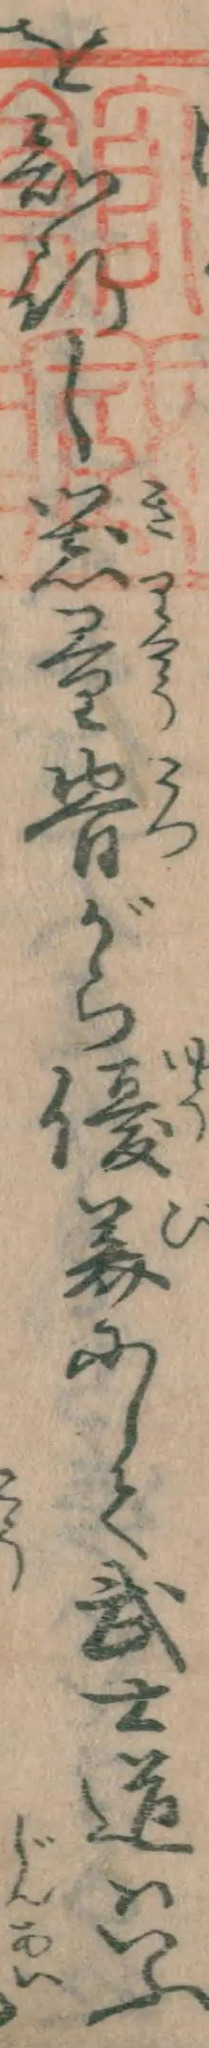を知行し器量骨がら優美にして武士道はいふ
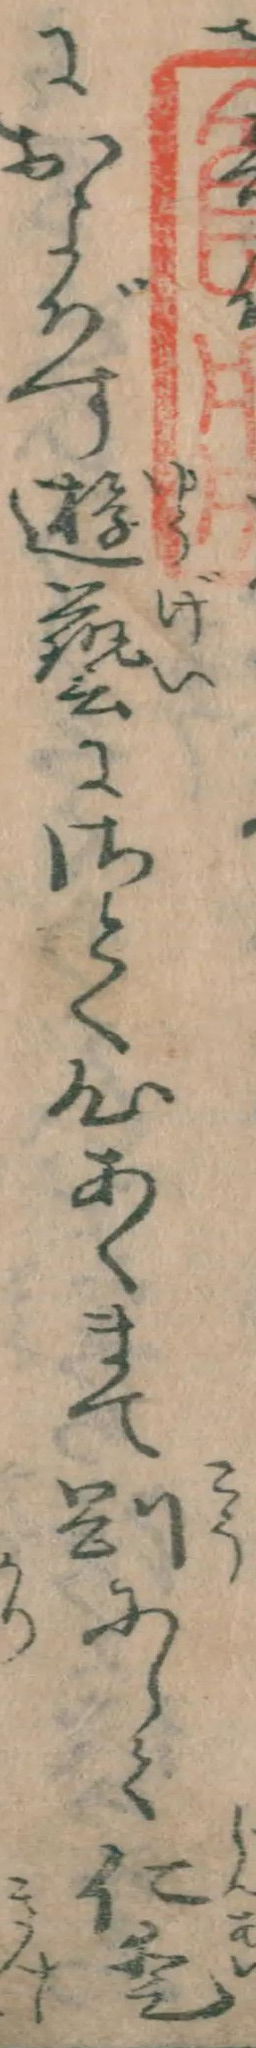におよばず遊芸にさとく心あくまて剛にして仁愛
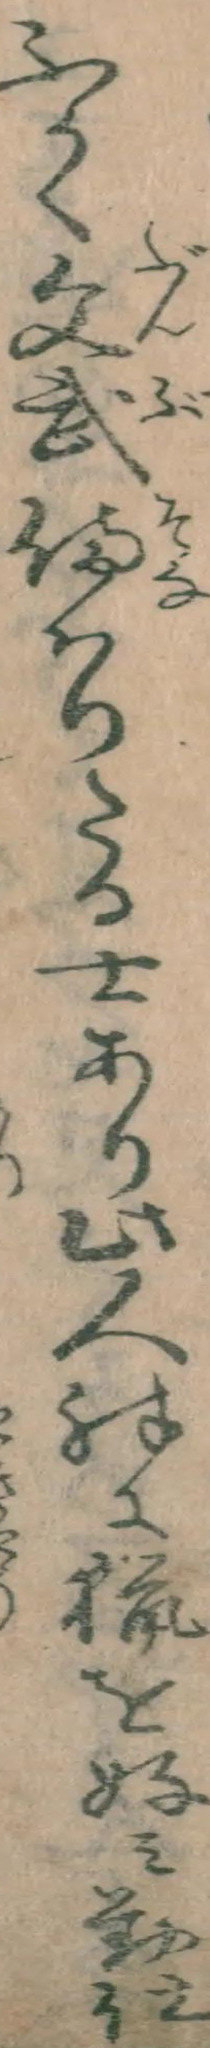ふかく文武備はりたる士あり此人殊に猟を好み勤仕
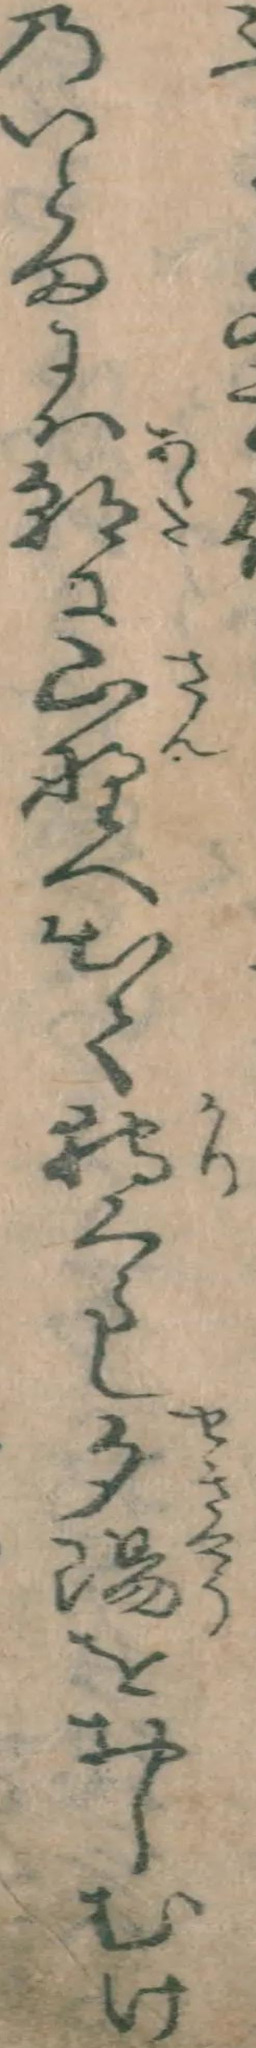のいとまには朝に山野へ出て狩くらし夕陽をおしむけ
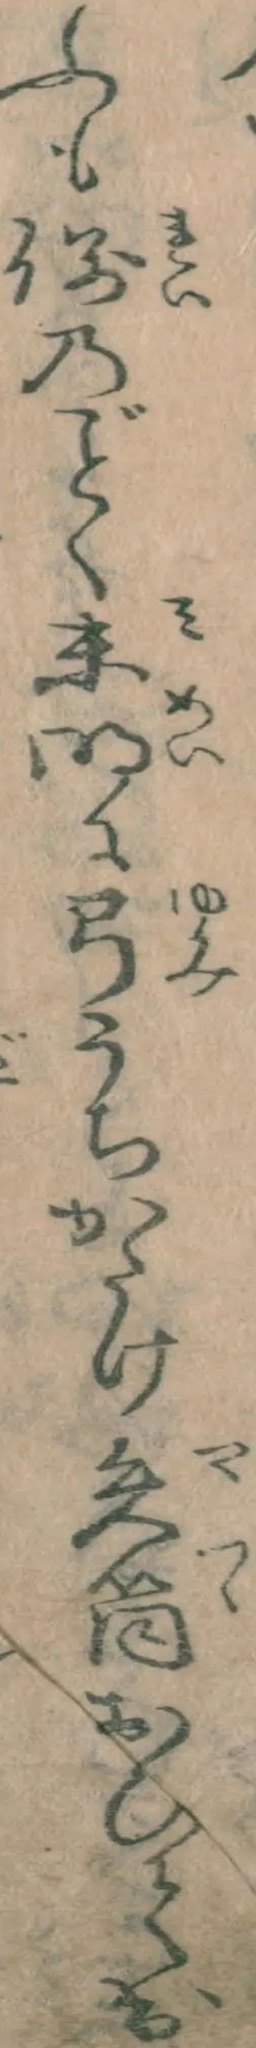ふも例のごとく未明に弓うちかたけ矢筒おひて出
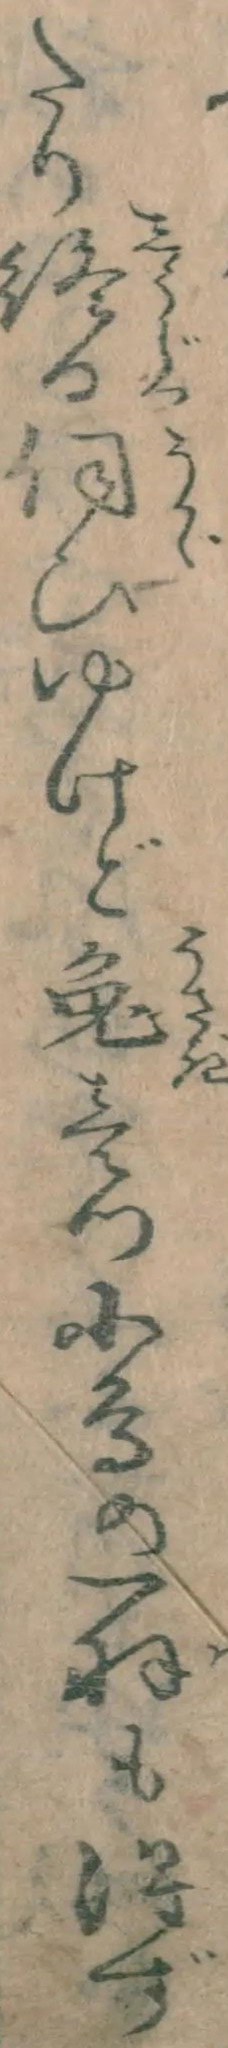たり終日伺ひゆけど兎壱つ小鳥の一羽も得ず

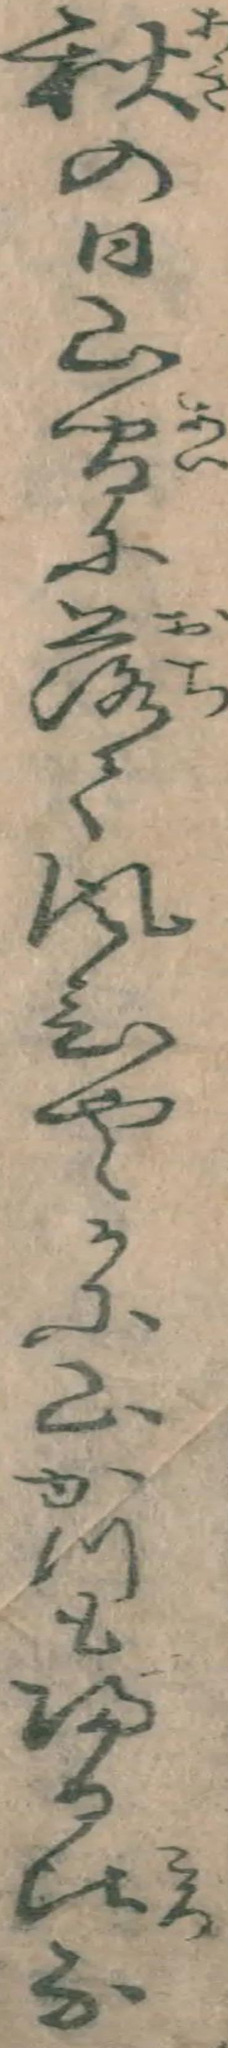秋の日山間に落て風ひやゝかに山かつも帰る頃な
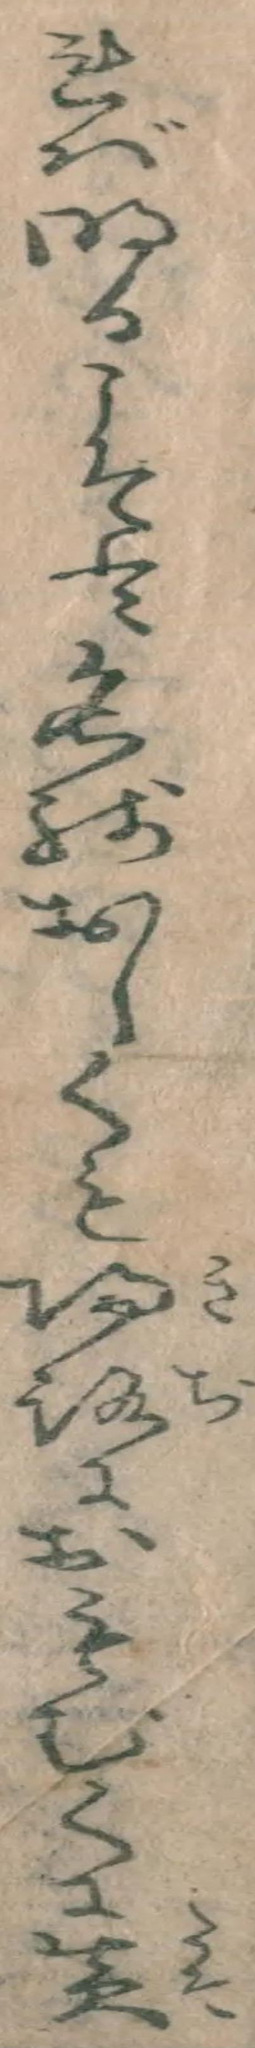れば明日こそと名残おしくも帰路におもむくに黄
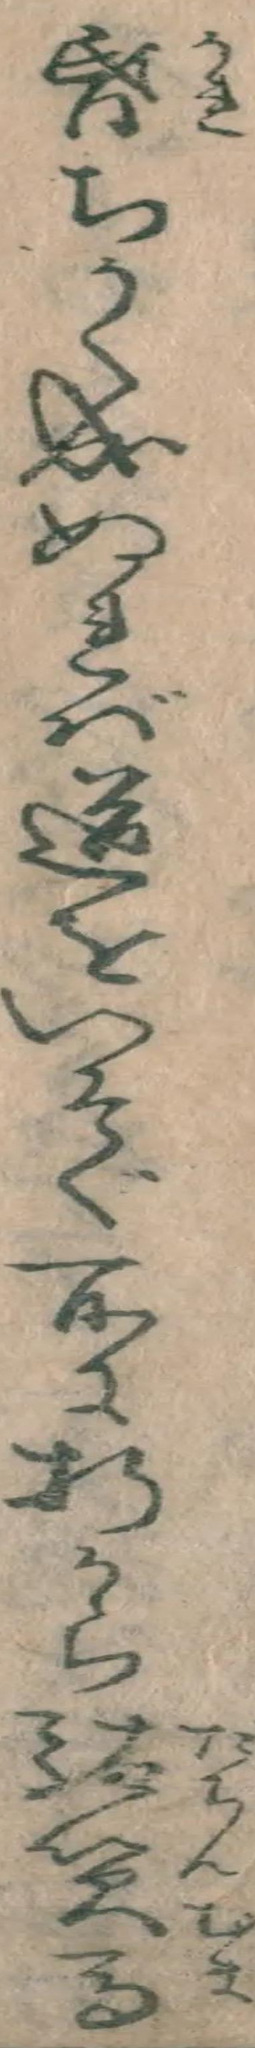昏ちかく成ぬれば道をいそぐ所に折から駄賃馬
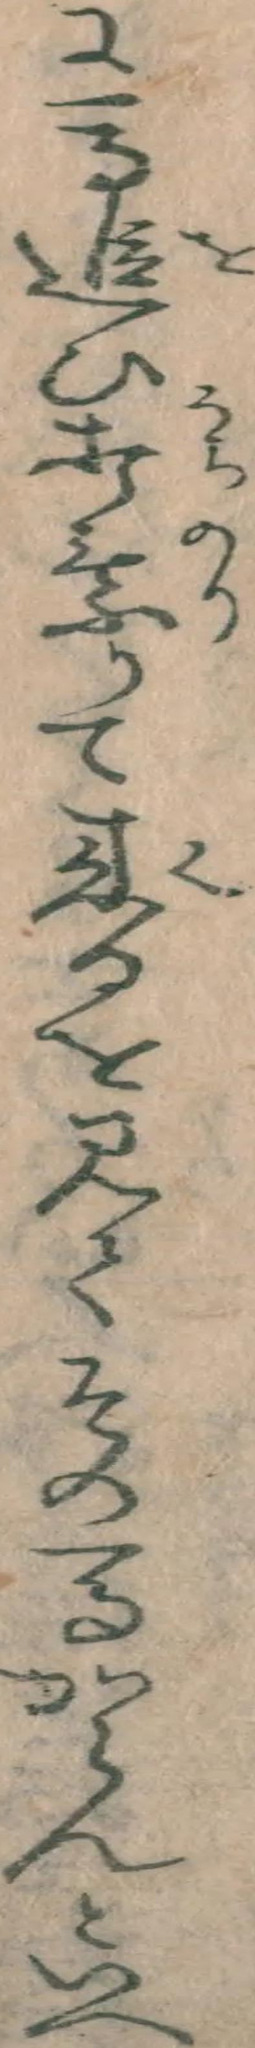に馬追ひ打乗て来るを見てその馬からんといへ
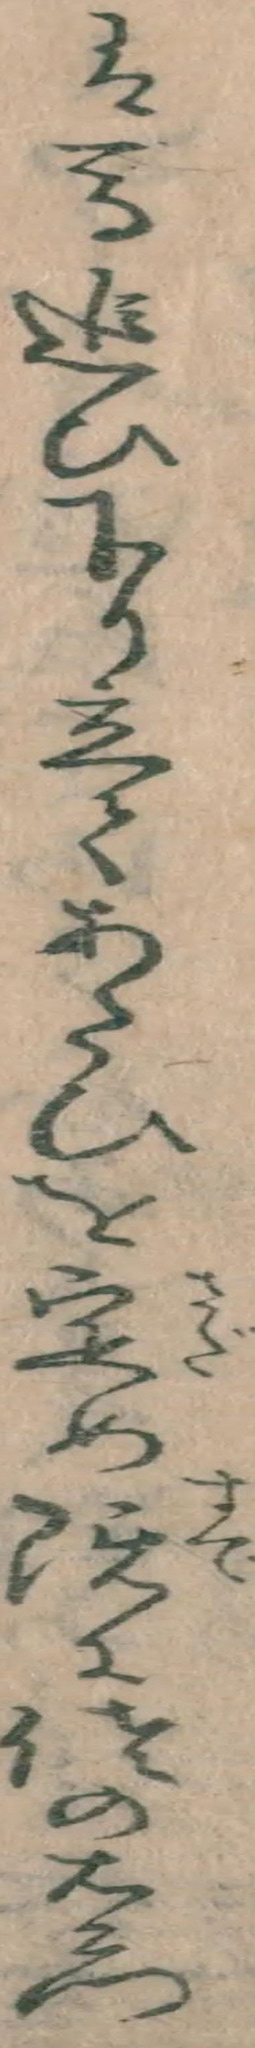は馬追ひ下り立てあたひを定め既に佐の右衛門
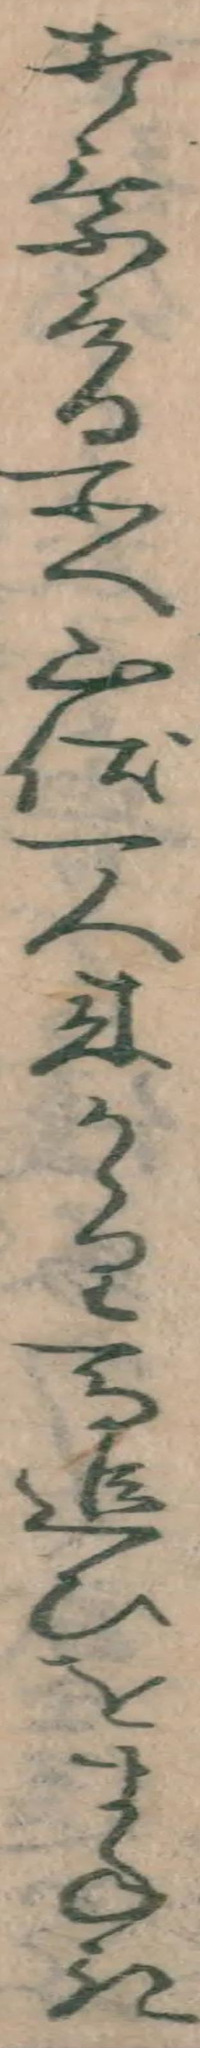打乗ける所へ山伏一人来かゝり馬追ひをまねき
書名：怪談御伽童 5巻. [2]
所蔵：国立国会図書館 National Diet Library, JAPAN
